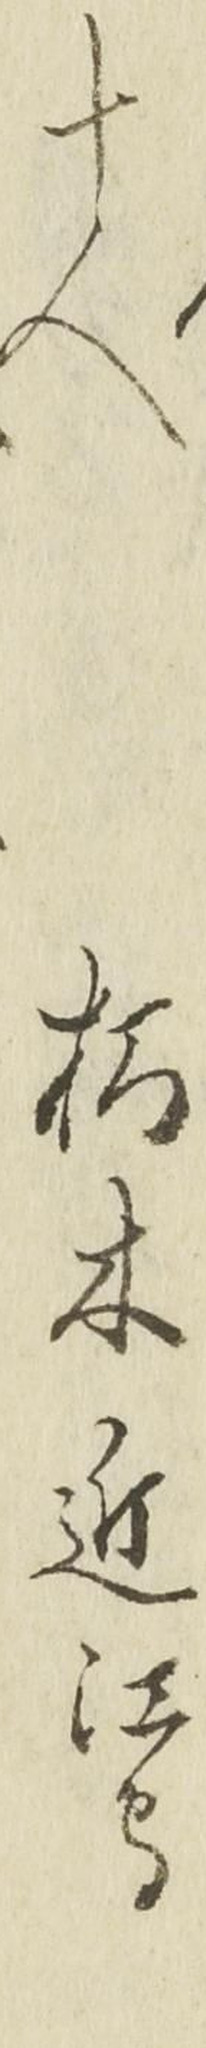十人朽木近江守
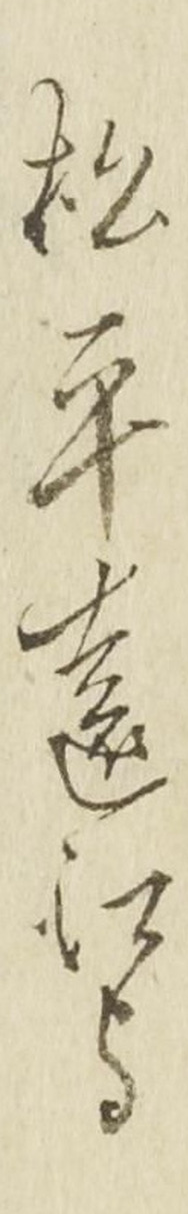松平伊賀守
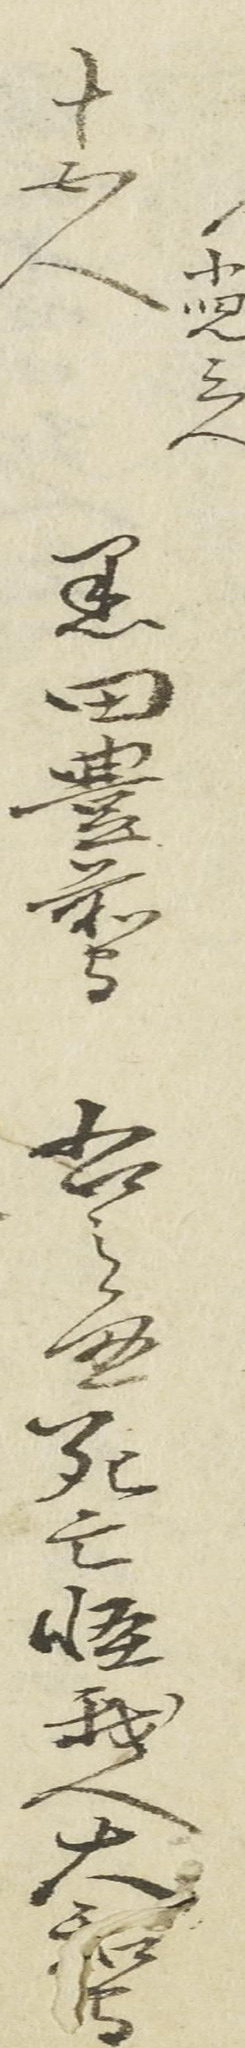十五人黒田豊前守右之通死亡怪我人大和守
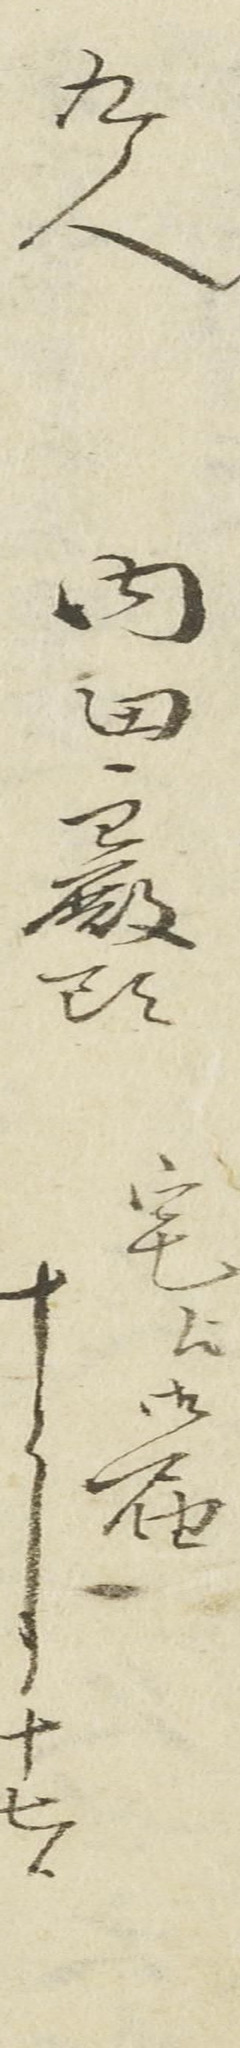九人内田主殿頭宅え御届
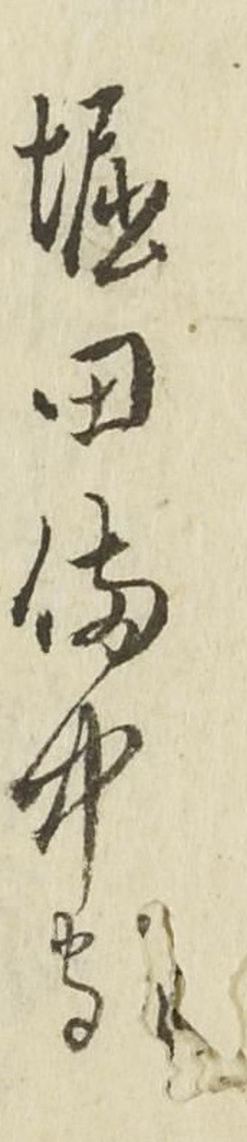堀田備中守
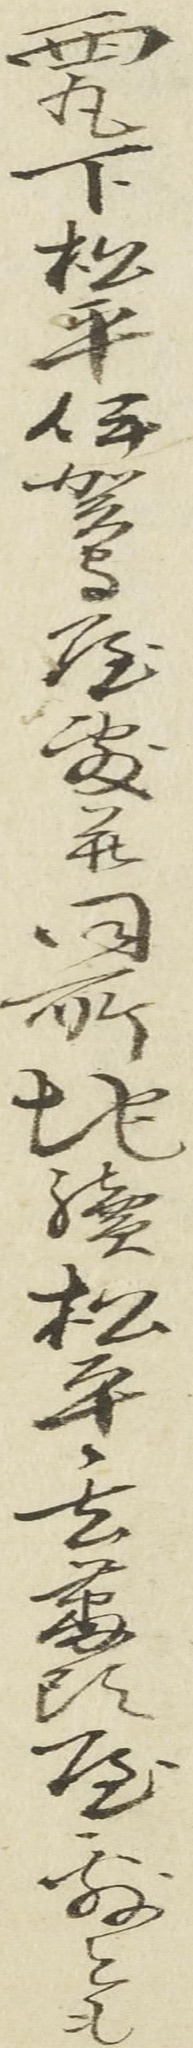西丸下松平伊賀守屋敷幷同所地続松平玄蕃頭屋敷とも
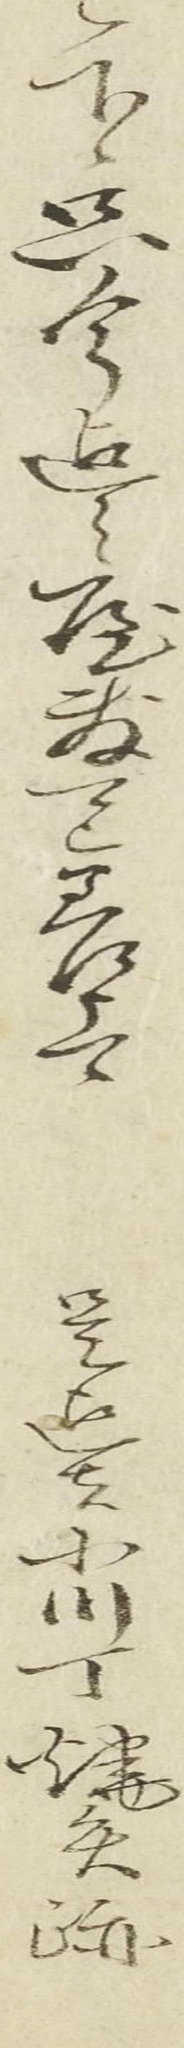被下候只今迄之屋敷可被差上候是迄羽小川丁焼失跡
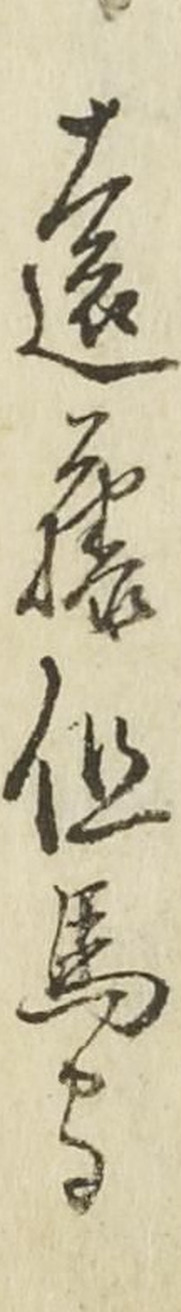遠藤但馬守
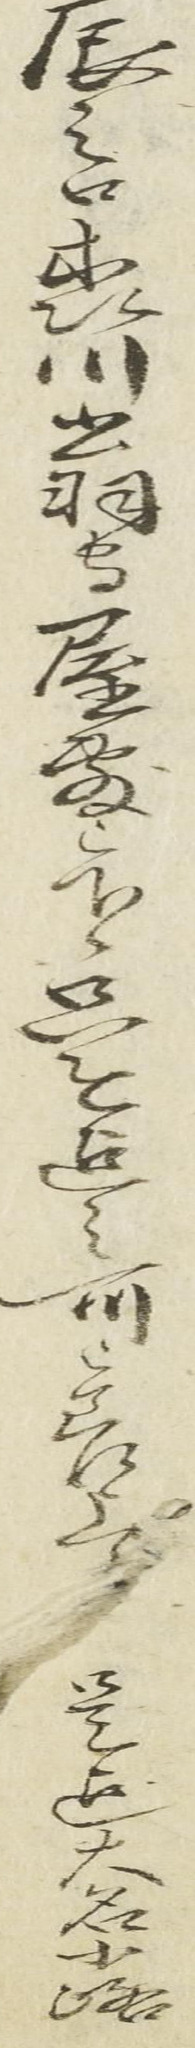辰之口森川出羽守屋敷被下候只今迄之可被差上候是迄大名小路
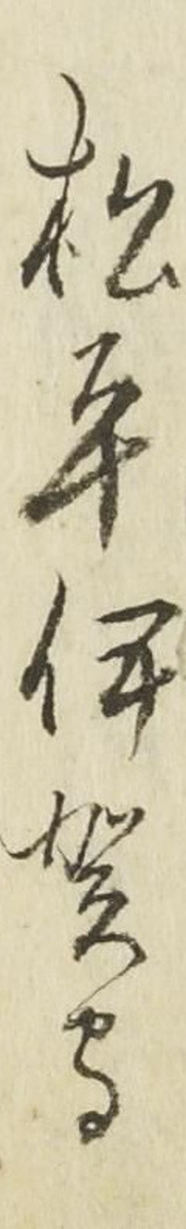松平伊賀守
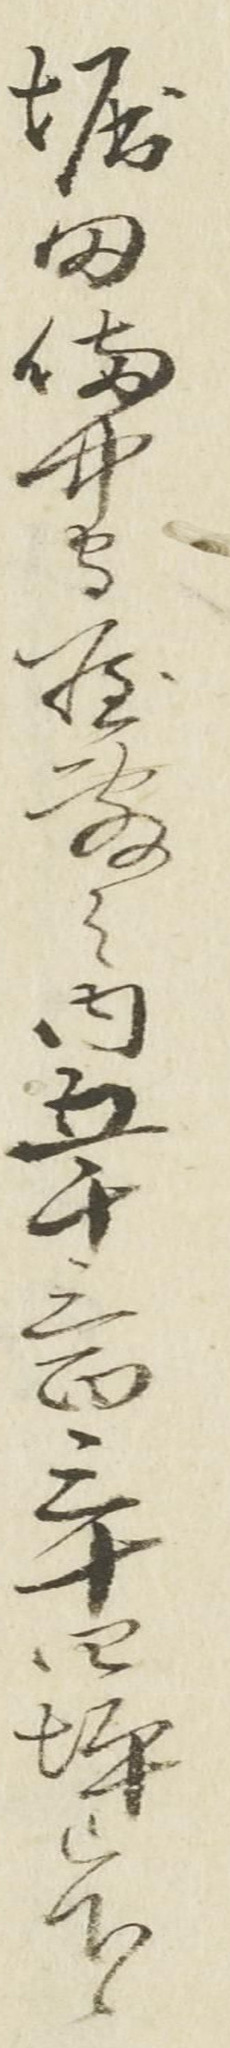堀田備中守屋敷之内五千三百三十四坪被下候
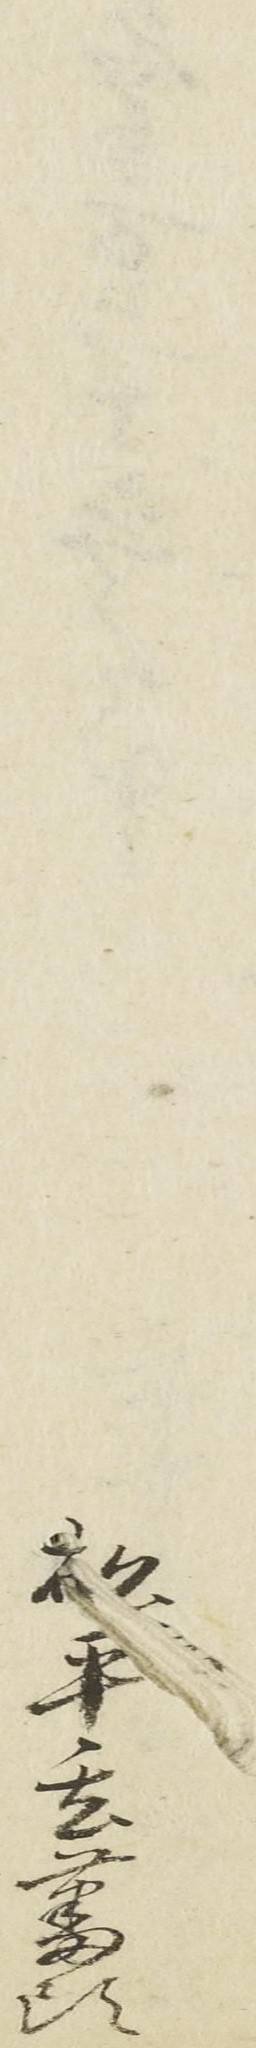松平玄蕃頭
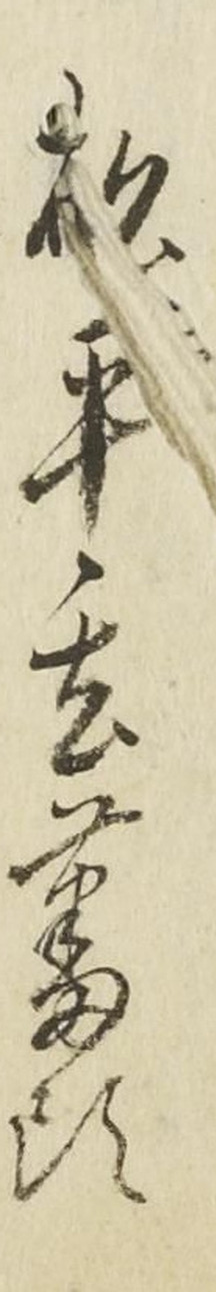松平玄蕃頭
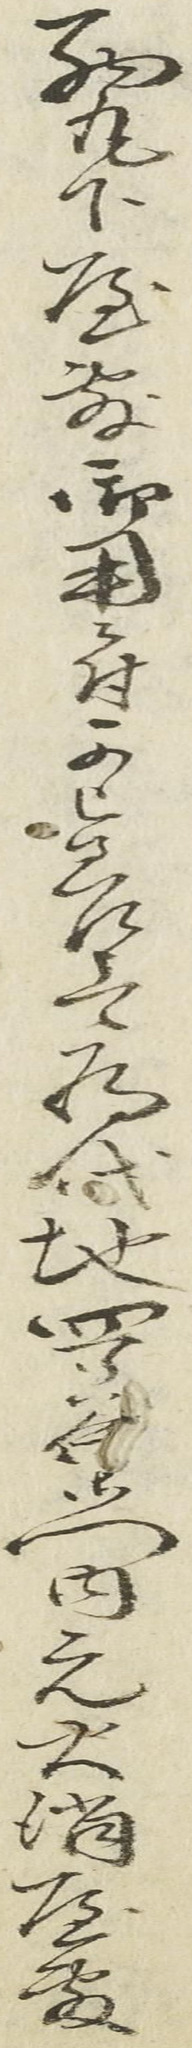西丸下屋敷御用ニ付可被差上候為代地四谷御門内元火消屋敷
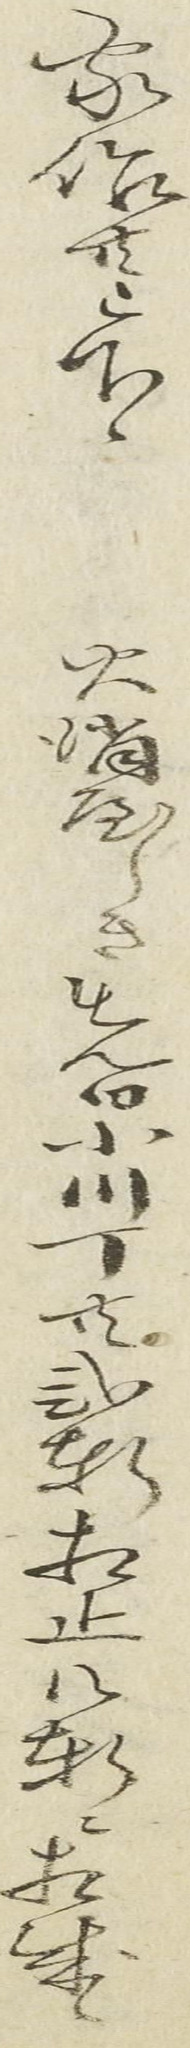家作共被下候火消屋しき先日小川丁共弐軒相止八軒ニ相成候
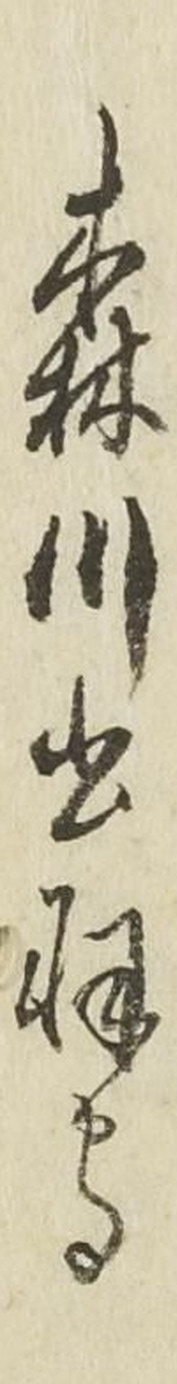森川出羽守
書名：安政二乙卯年十月二日大地震之事
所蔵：東京大学地震研究所図書室 Earthquake Research Institute Library, The University of Tokyo, JAPAN
